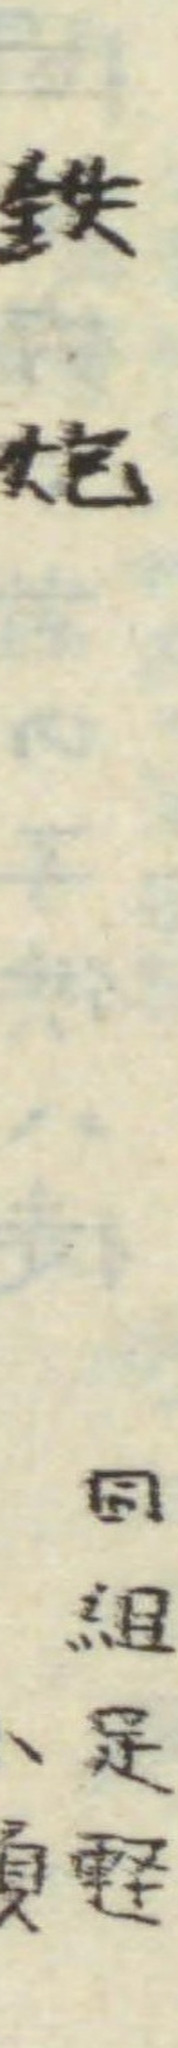鉄炮同組足軽
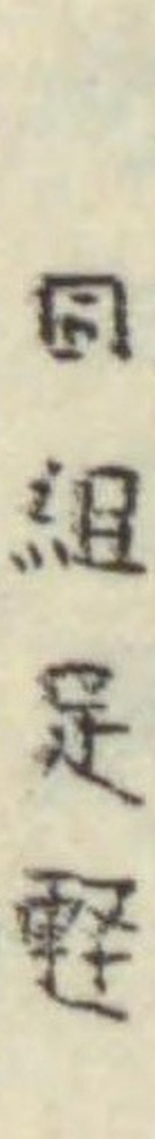同組足軽
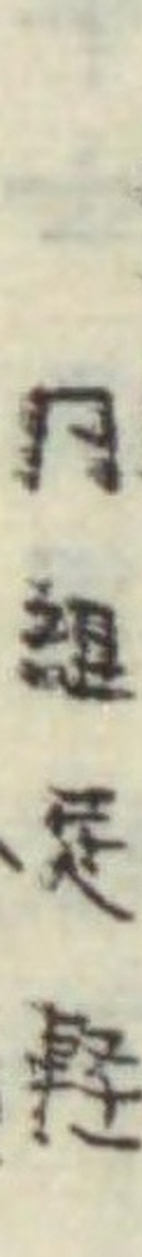同組足軽
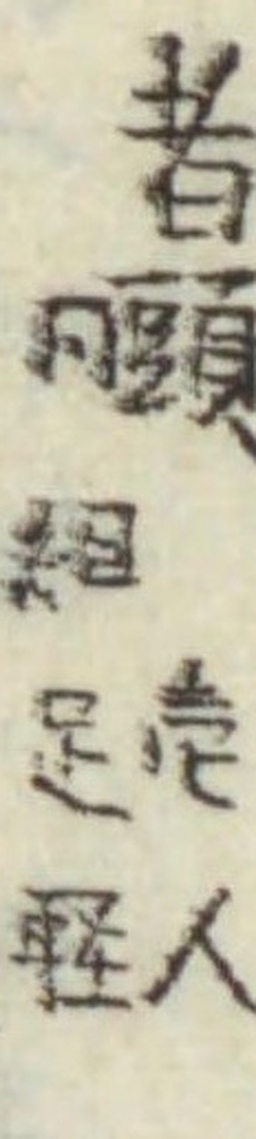同組足軽
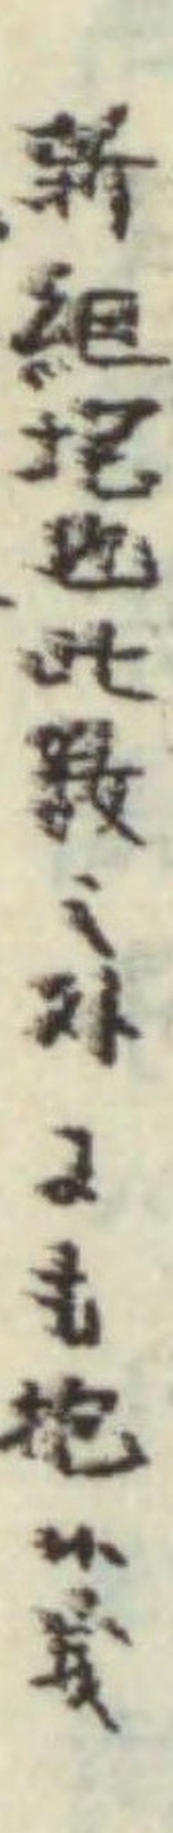新組地廻此数之外にも抱候義
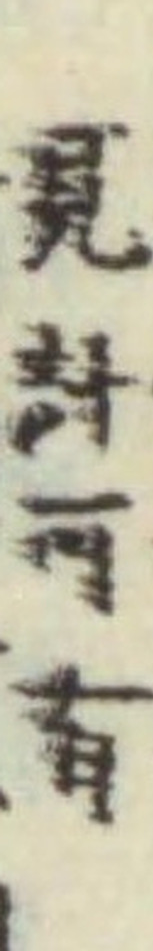見計可有
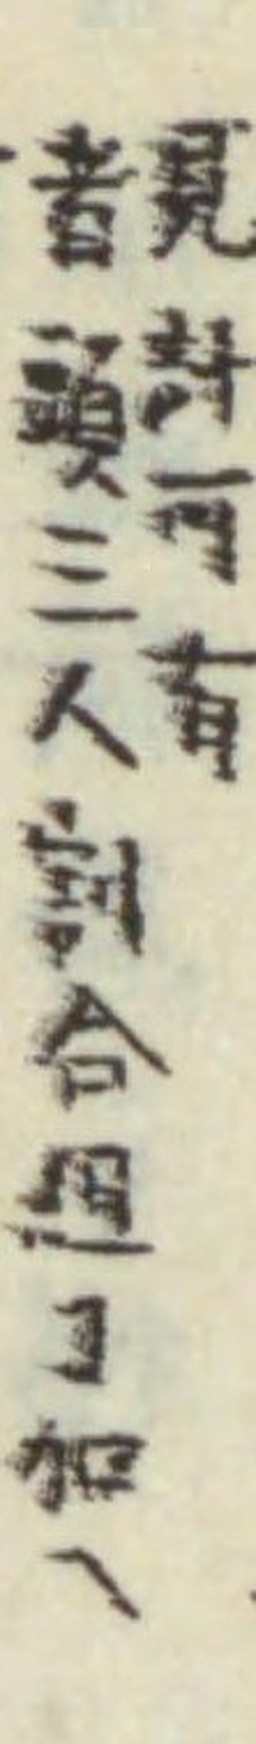者頭三人割合組に加へ
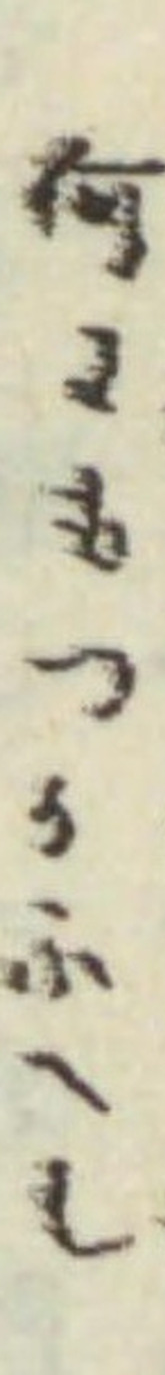何にもつかふへし
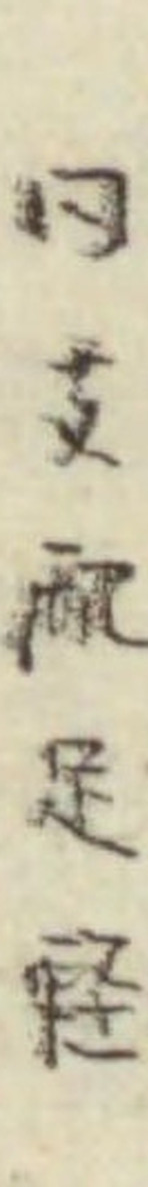同支配足軽
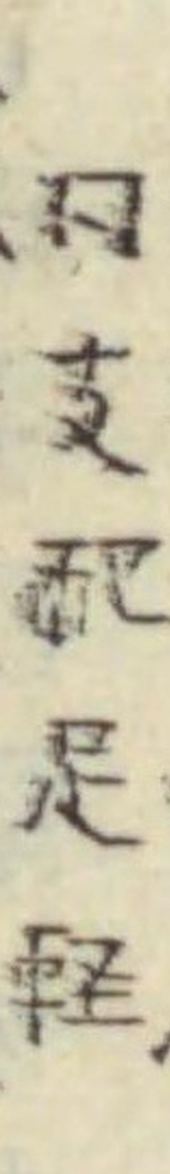同支配足軽
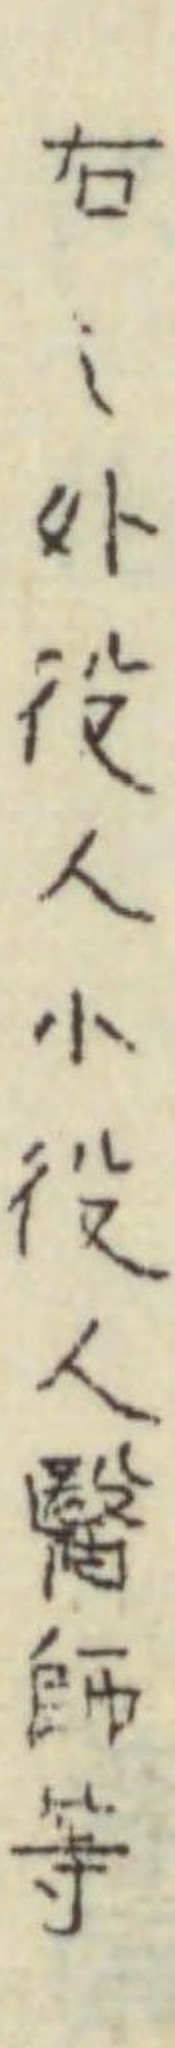右之外役人小役人医師等
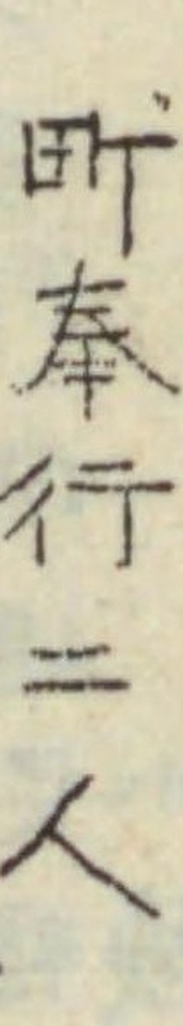郡奉行二人
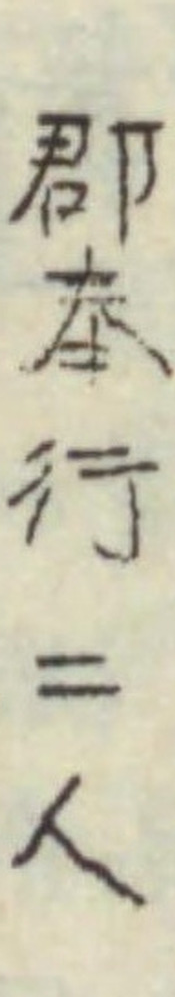郡奉行二人
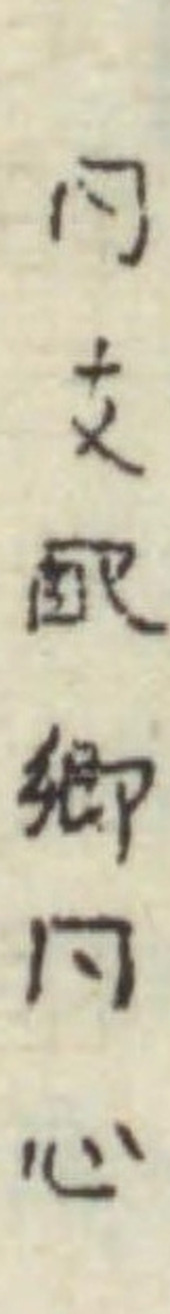同支配郷同心
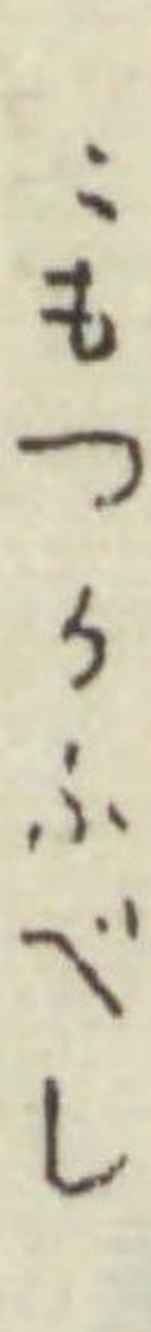何にもつかふへし
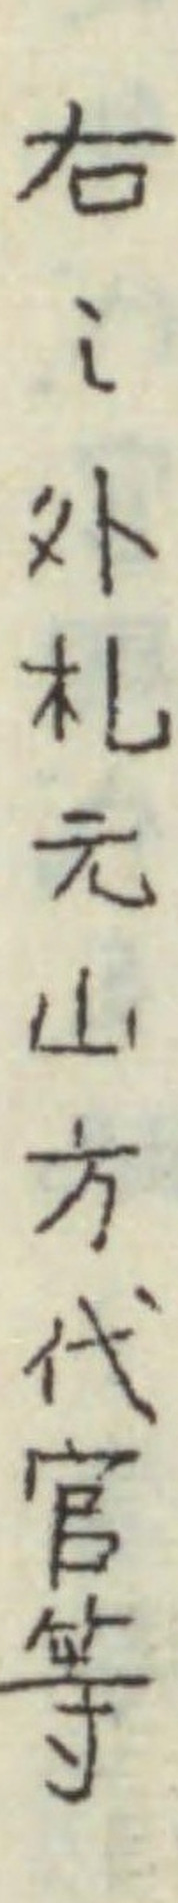右之外札元山方代官等
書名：三河吉田藩動員史料
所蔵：国立国会図書館 National Diet Library, JAPAN
